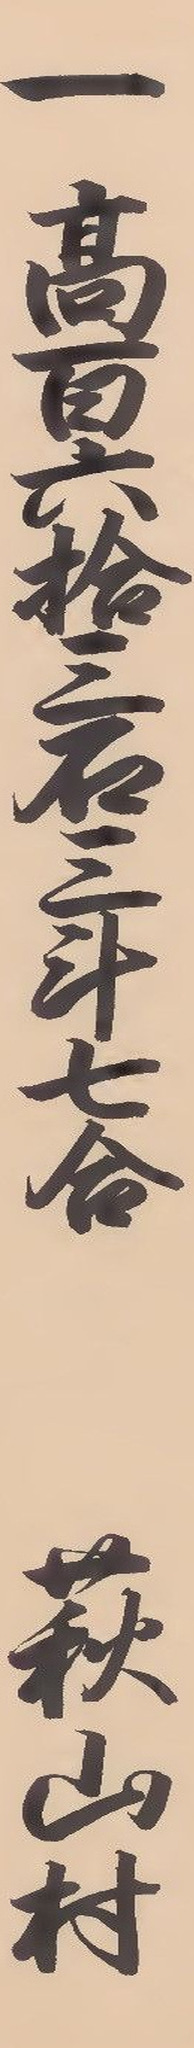一高百六拾三石三斗七合萩山村
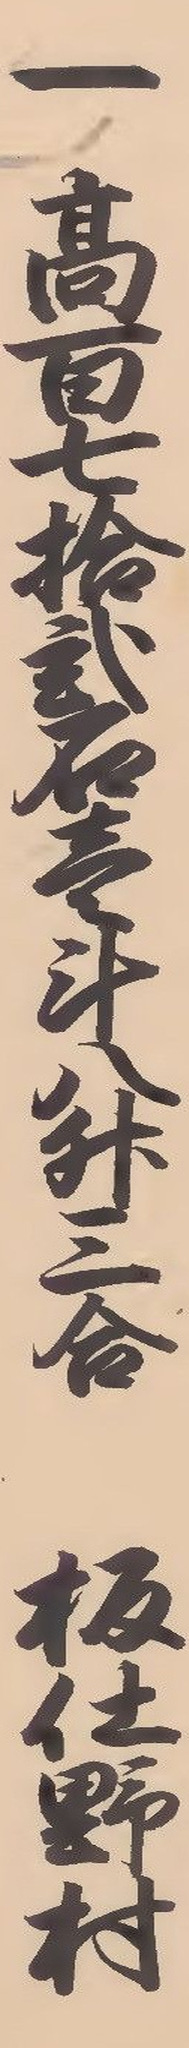一高百七拾弐石壱斗八升三合板仕野村

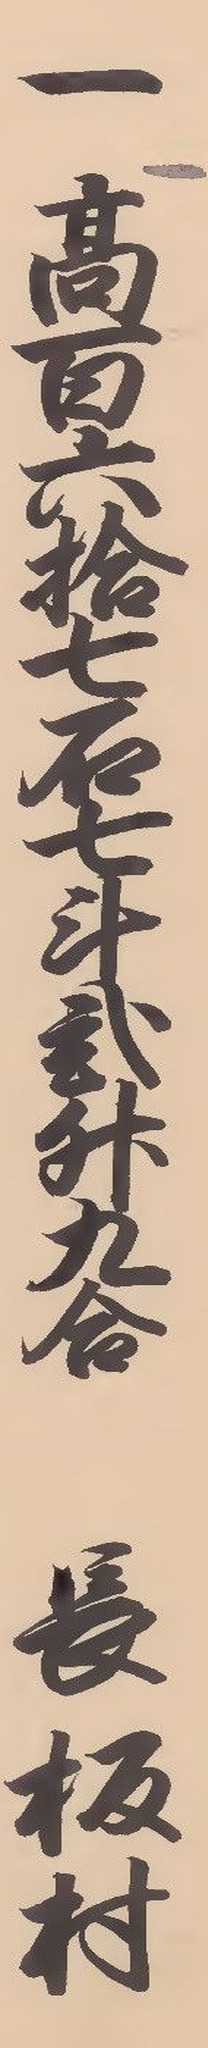一高百六拾七石七斗弐升九合長坂村
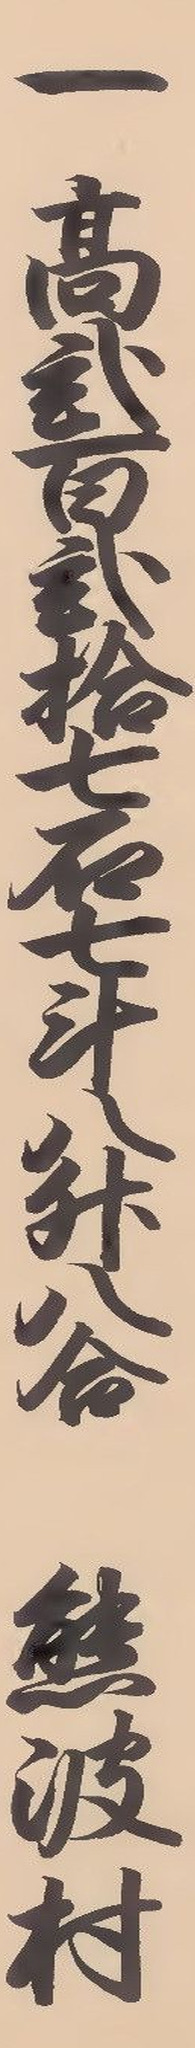一高弐百弐拾七石七斗八升八合熊波村
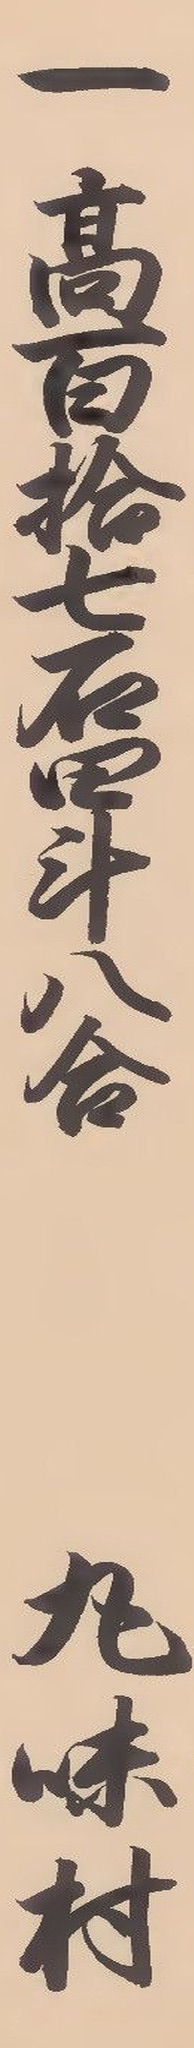一高百拾七石四斗八合丸味村
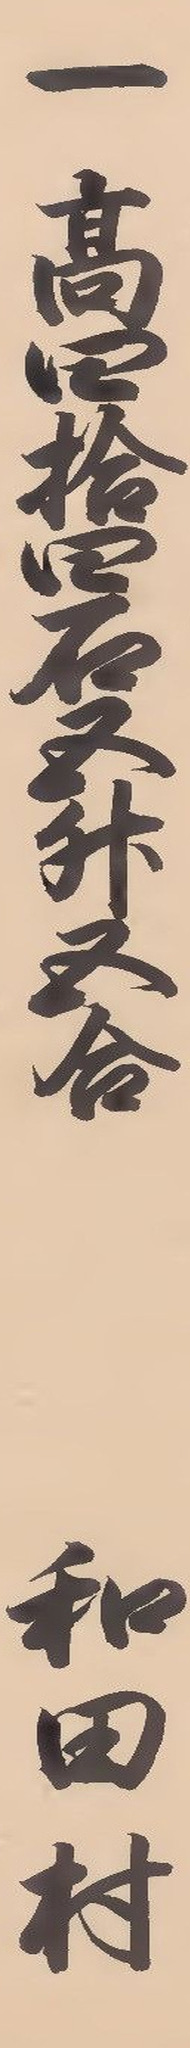一高四拾四石五升五合和田村
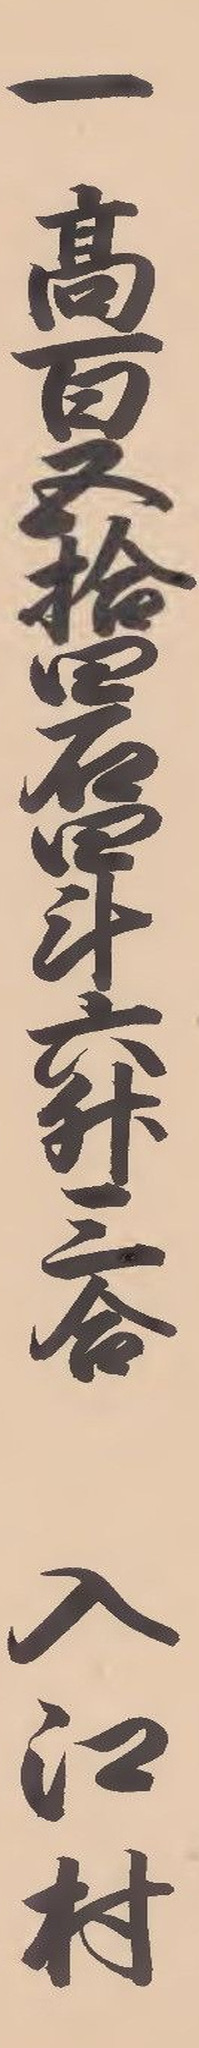一高百五拾四石四斗六升三合入江村
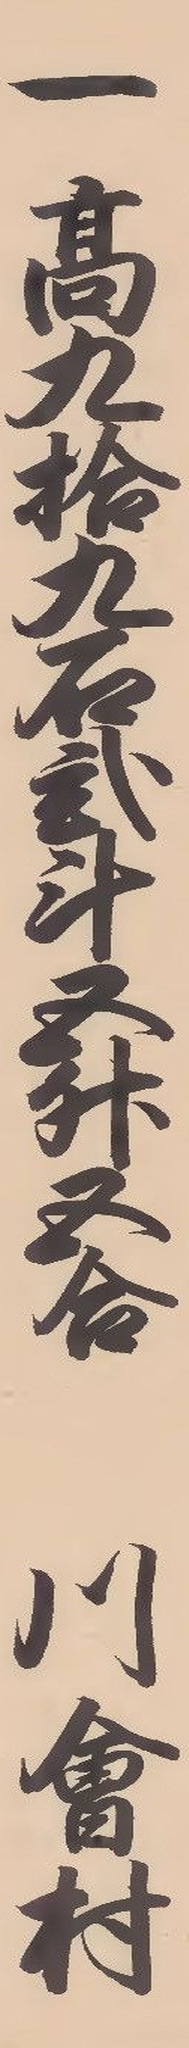一高九拾九石弐斗五升五合川会村
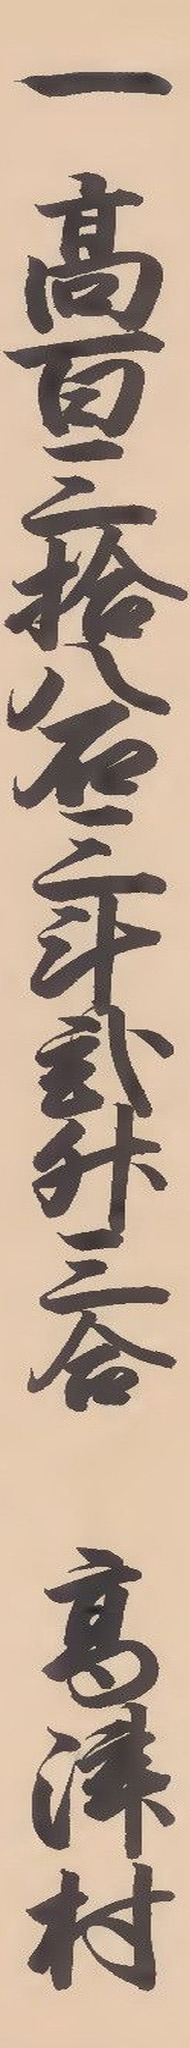一高百三拾八石三斗弐升三合高津村
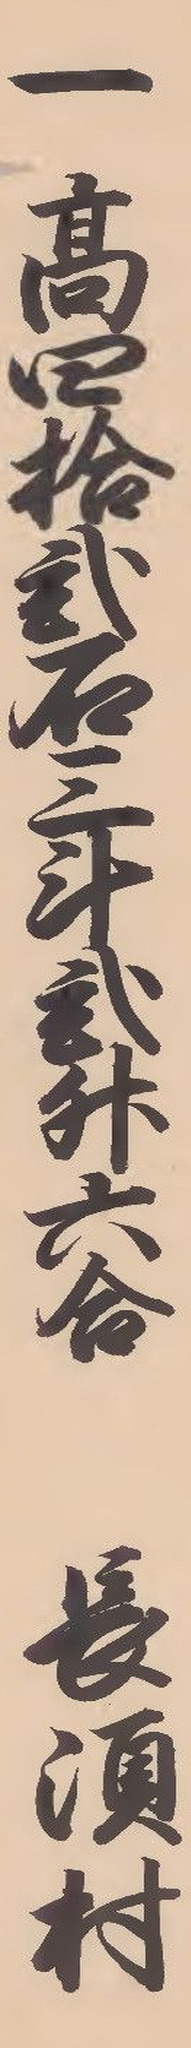一高四拾弐石三斗弐升六合長須村

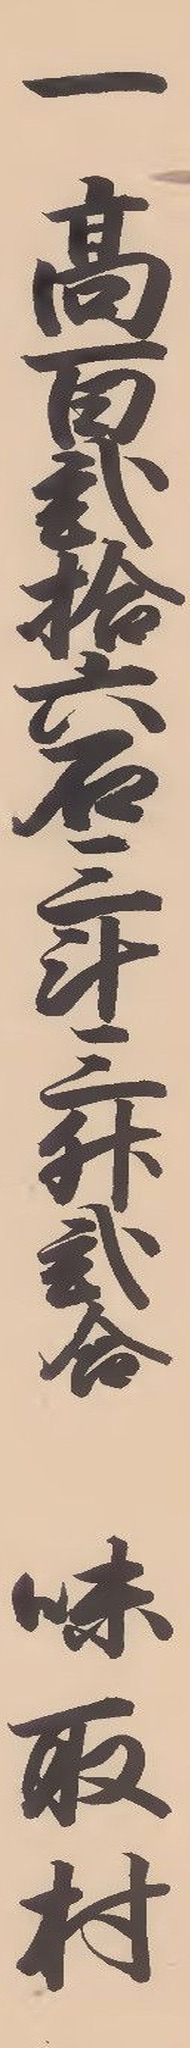一高百弐拾六石三斗三升弐合味取村
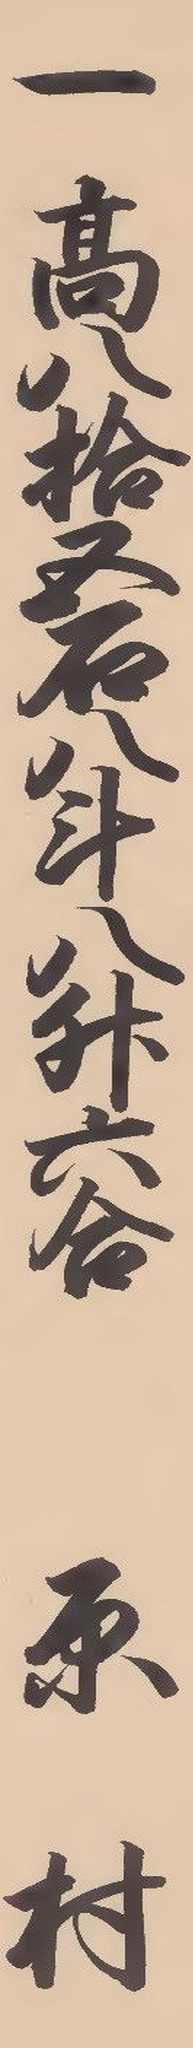一高八拾五石八斗八升六合原村
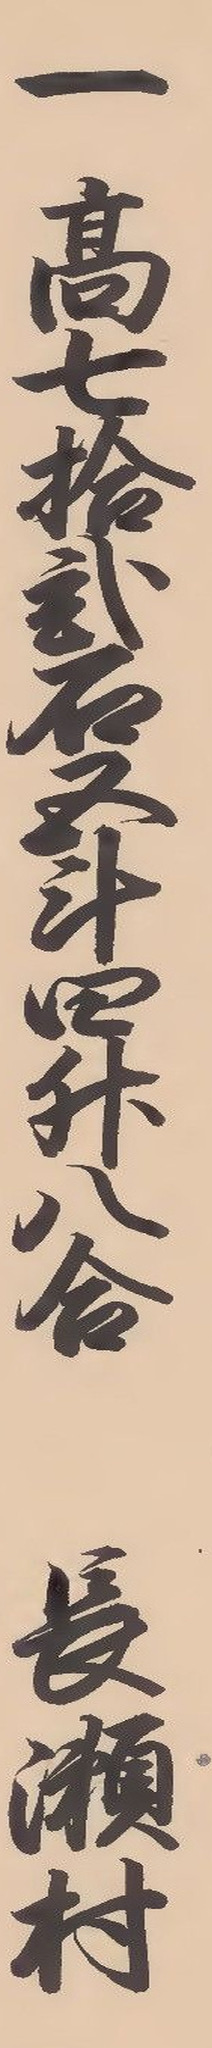一高七拾弐石五斗四升八合長瀬村
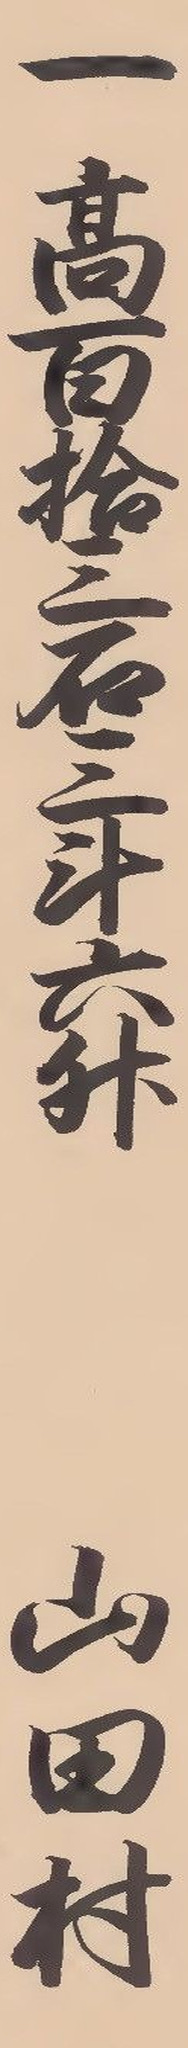一高百拾三石三斗六升山田村
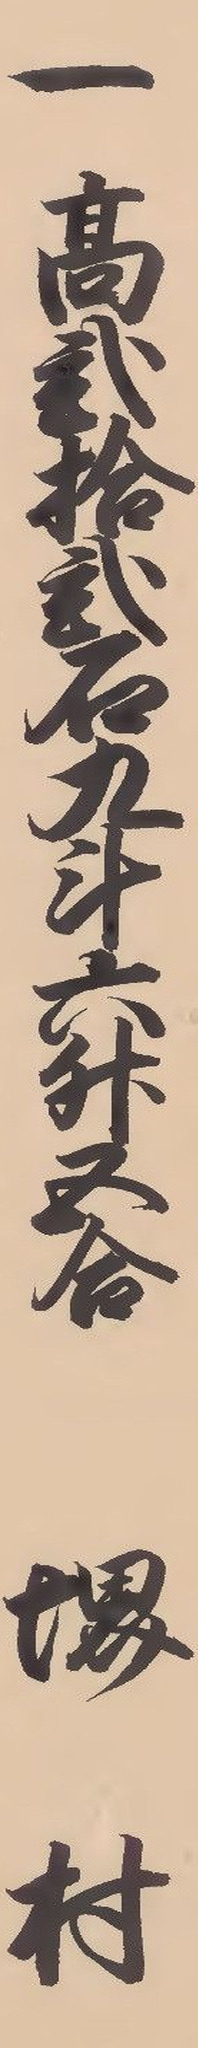一高弐拾弐石九斗六升五合堺村
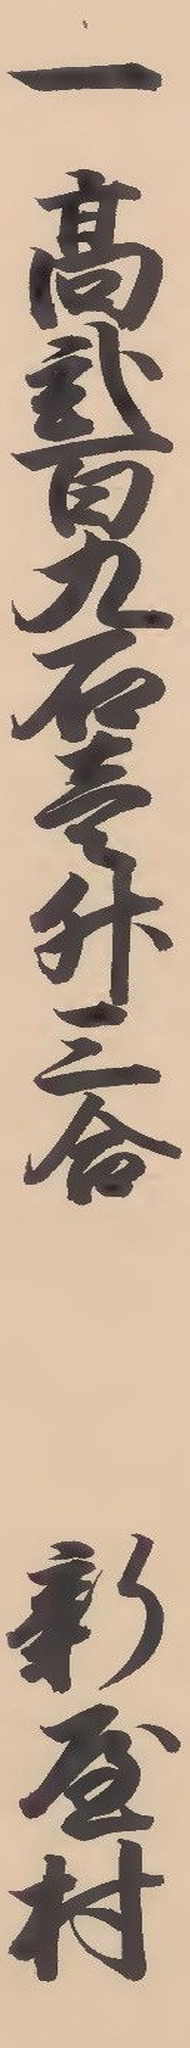一高弐百九石壱升三合新屋村
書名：但馬国郷帳
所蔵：国立公文書館 National Archives of Japan
